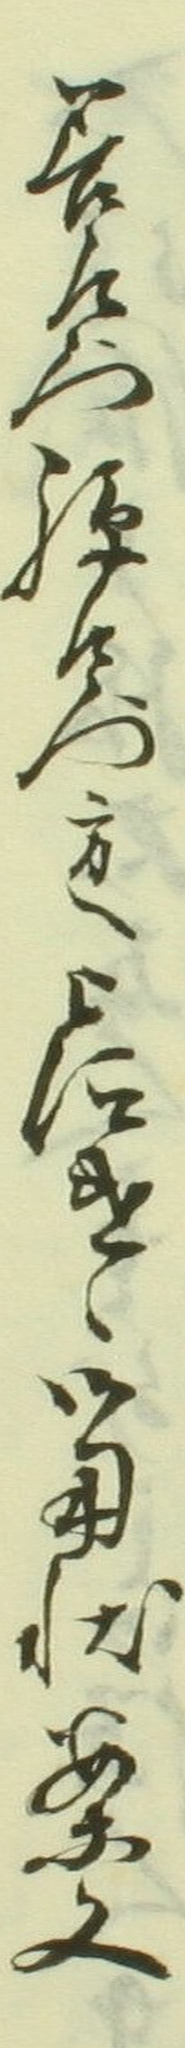善左衛門孫左衛門方へ被仰遣候御用状案文
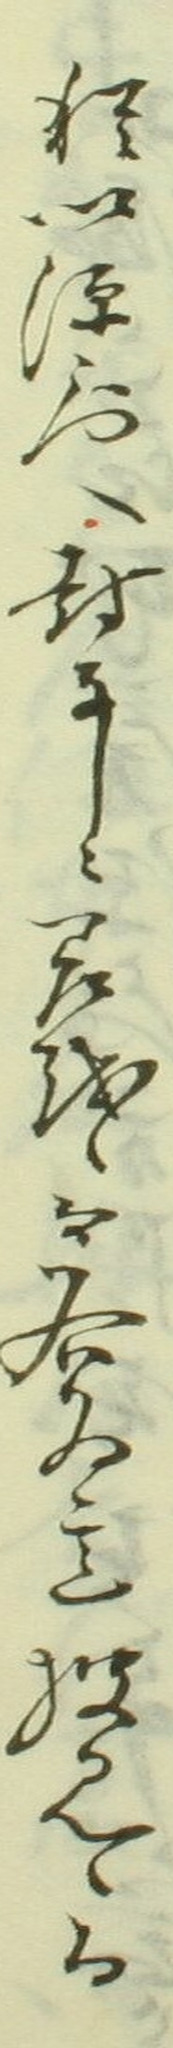猶以源右衛門へ遣し封なしに差越候而各為意披見候而
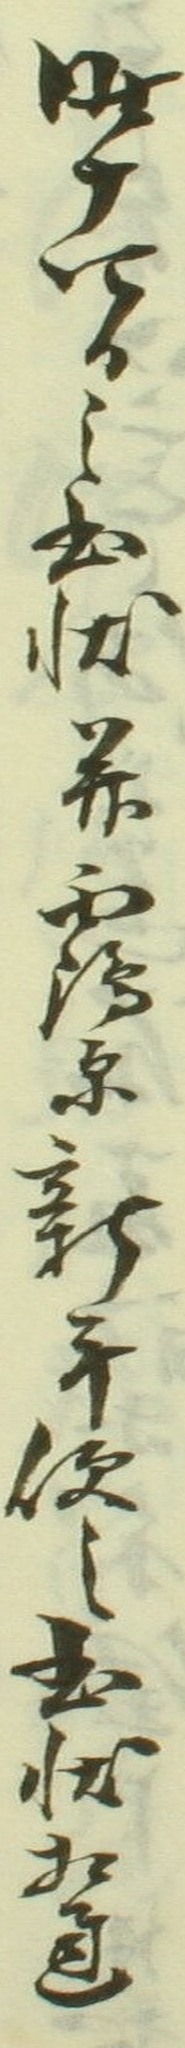昨十四日之書状并靏原新平便之書状相達
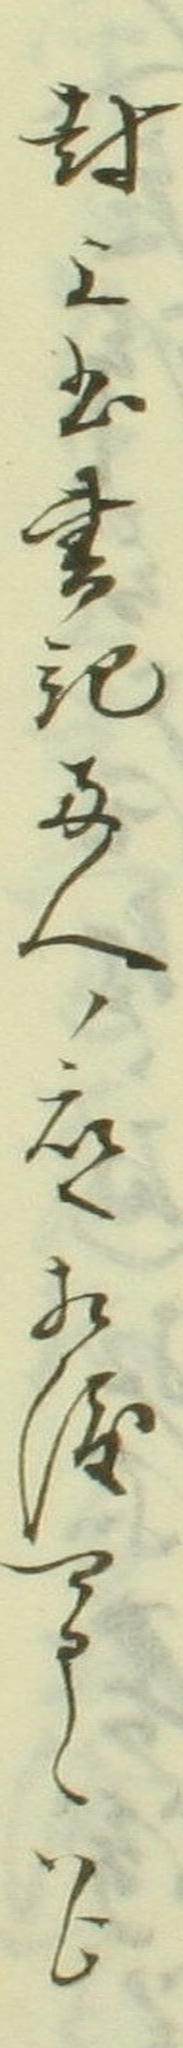封上書書記両人ノ衆へ相渡可申候以上
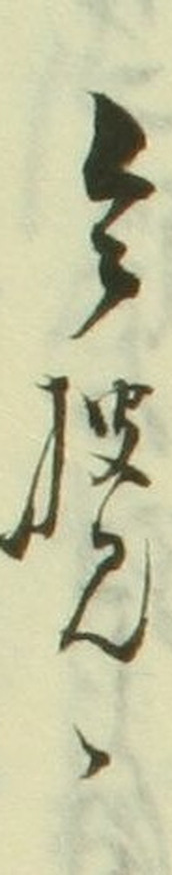令披見候
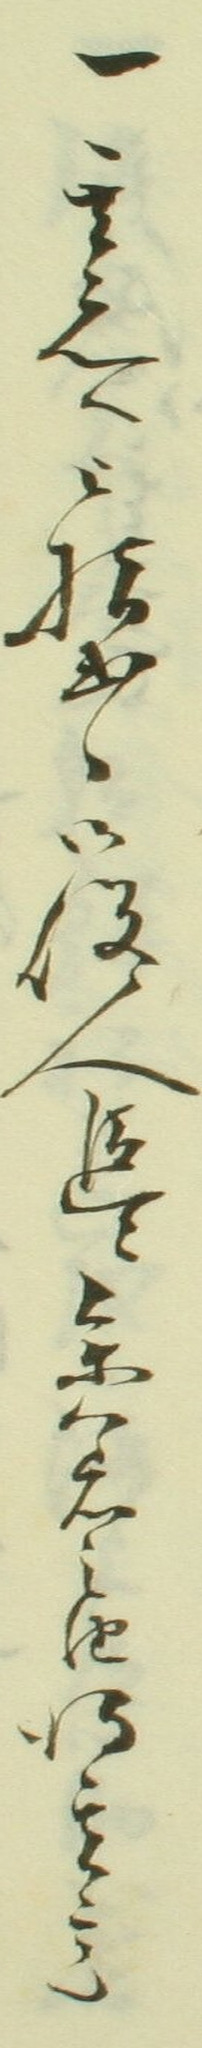一其元へ被指出候御役人追々参着之由得其意
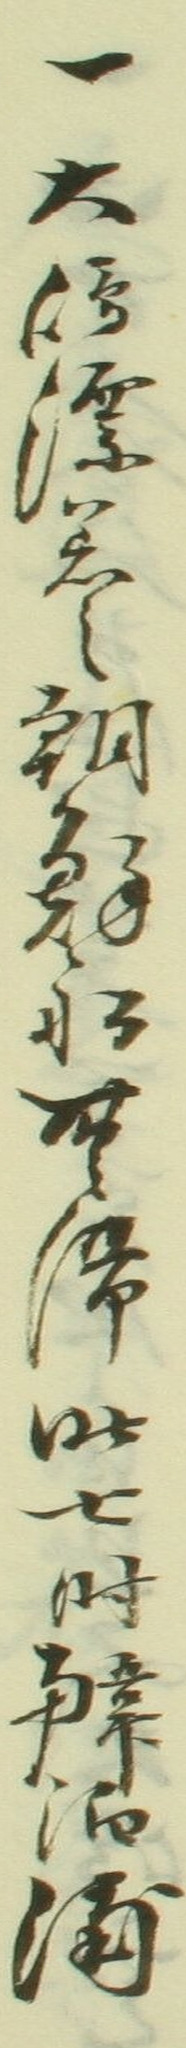一大嶋漂着之朝鮮船無滞昨七時韓泊浦
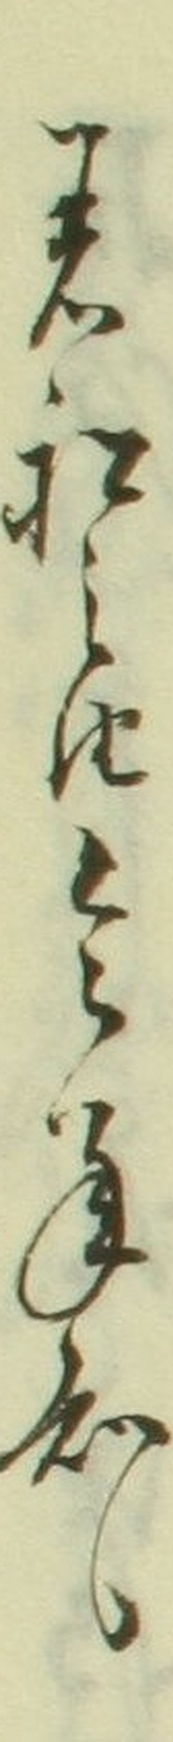着船之由令承知候
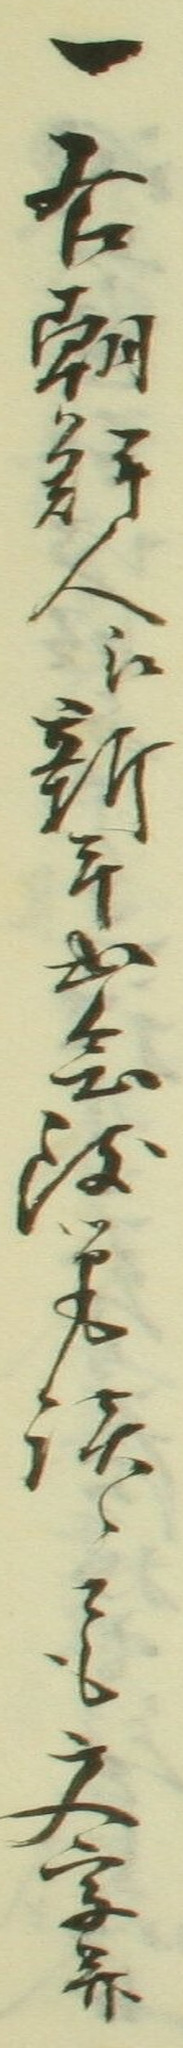一右朝鮮人江新平出会致筆談候ても文字并

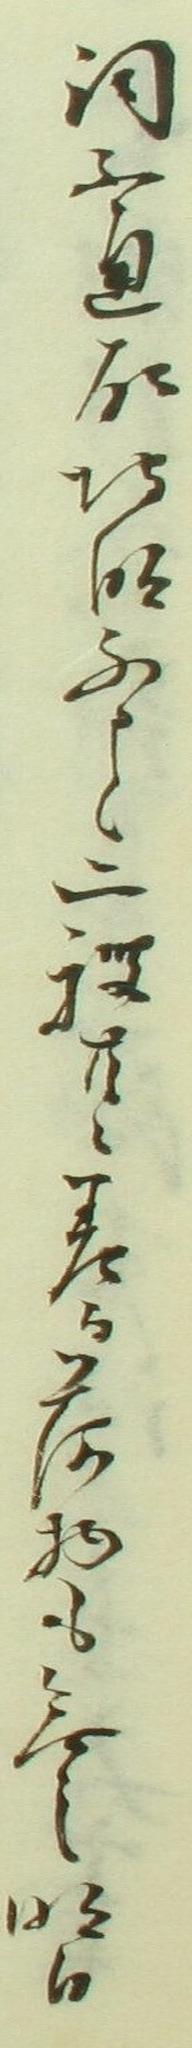詞不通故埒明不申候二艘共ニ差而荷物も無之明日
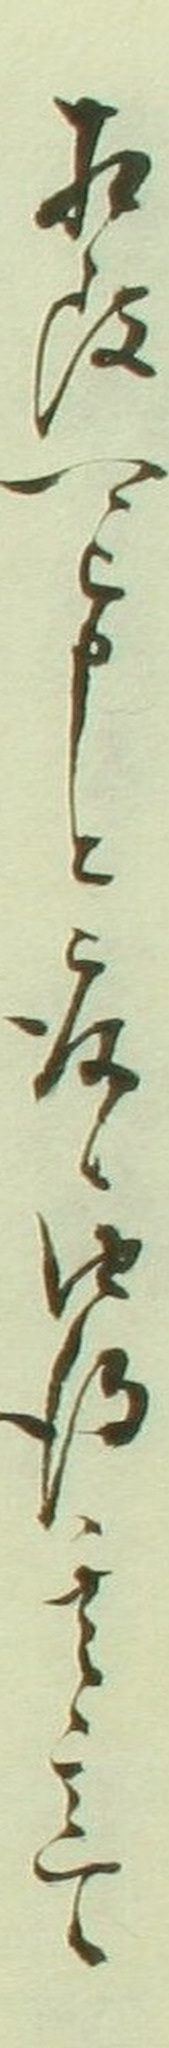相改可被申と被存候由得其意候
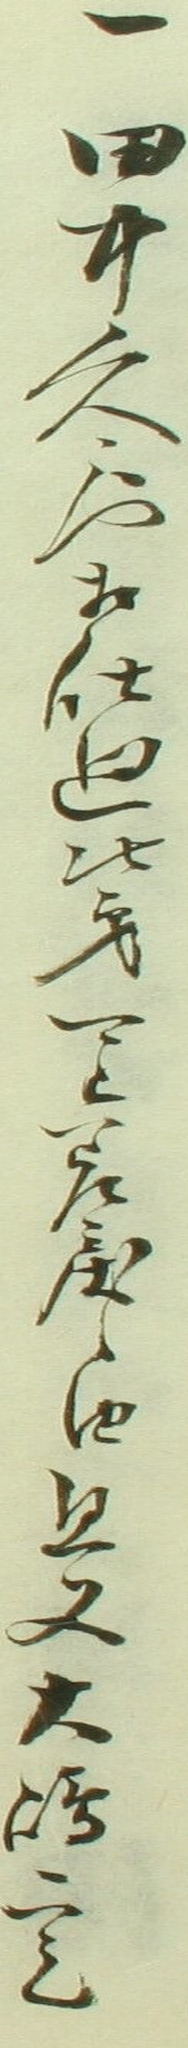一田中久右衛門相仕廻次第可被差戻候由且又大嶋定
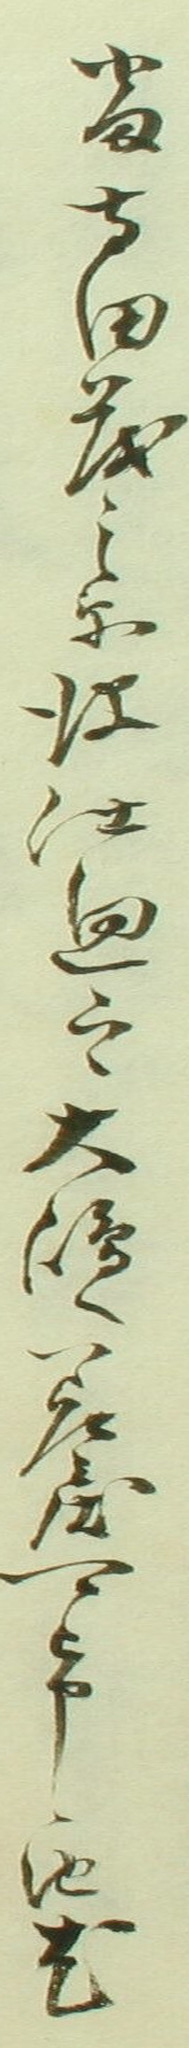番寺田茂兵衛儀仕廻候ハヽ大嶋へ差戻可被申由尤
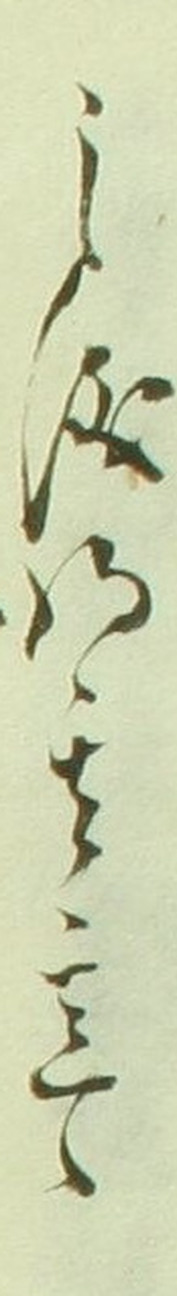之儀得其意候
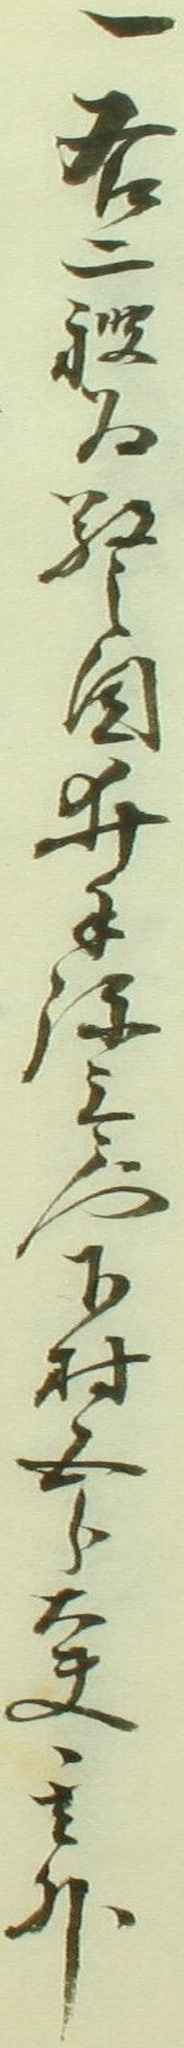一右弐艘為警固井手弥三右衛門下村五郎大夫其外
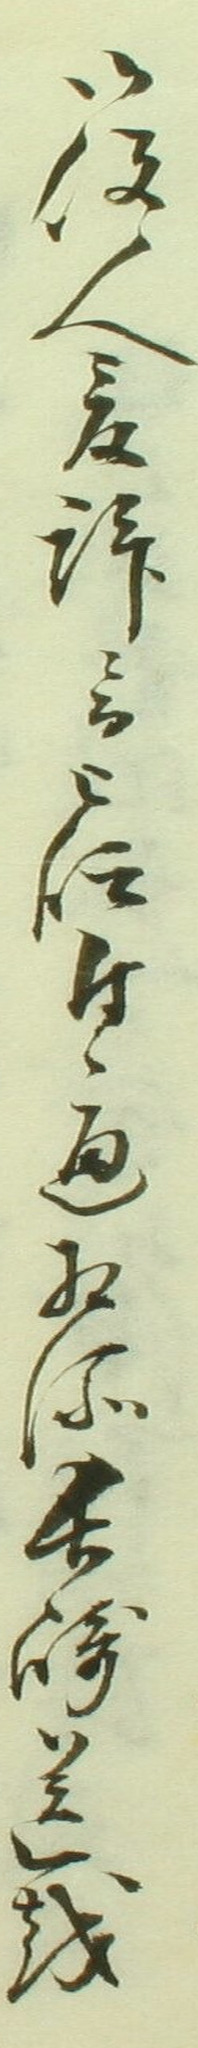御役人爰許ニ而被仰付候通相添長崎送越
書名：異国船漂着記
